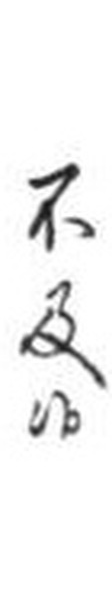不及候
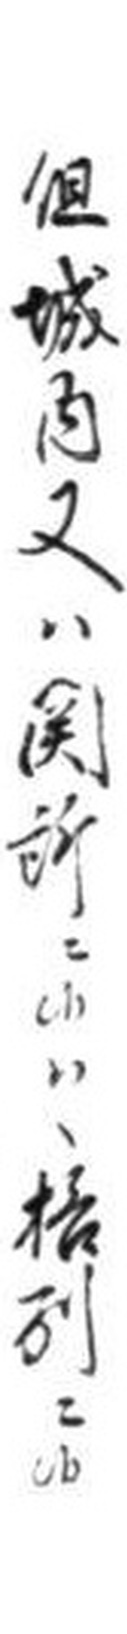但城内又ハ関所ニ候ハヽ格別ニ候
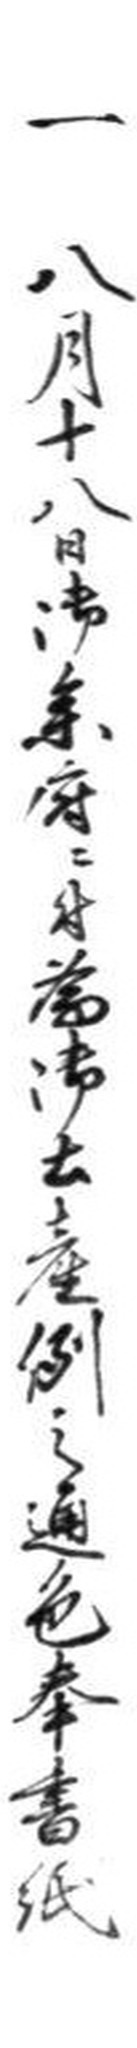一八月十八日御参府ニ付為御土産例之通色奉書紙
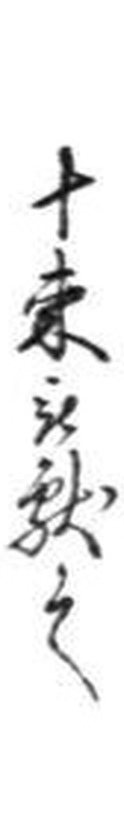十束被献之
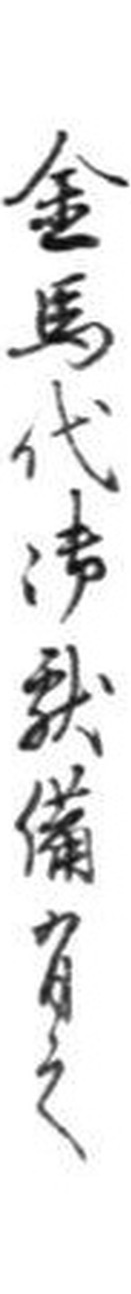金馬代御献備有之
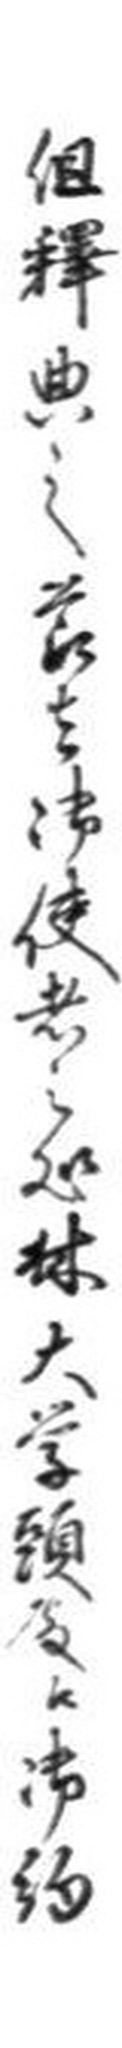但釈典之節者御使者之処林大学頭殿江御約
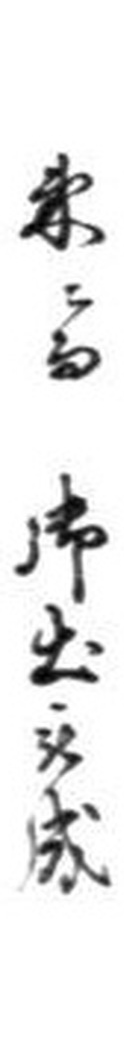束ニ而御出被成
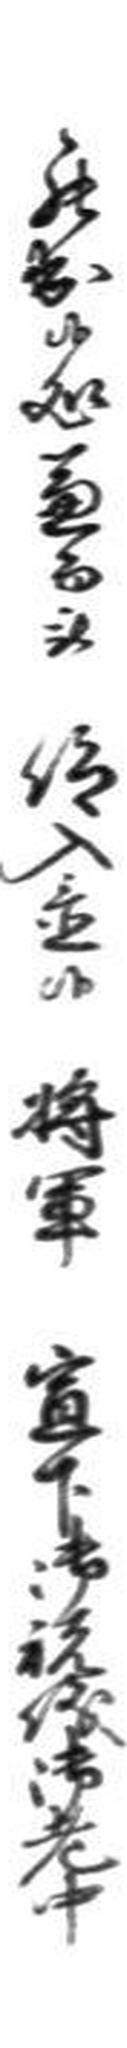罷出候処兼而被仰入置候将軍宣下御祝儀御老中
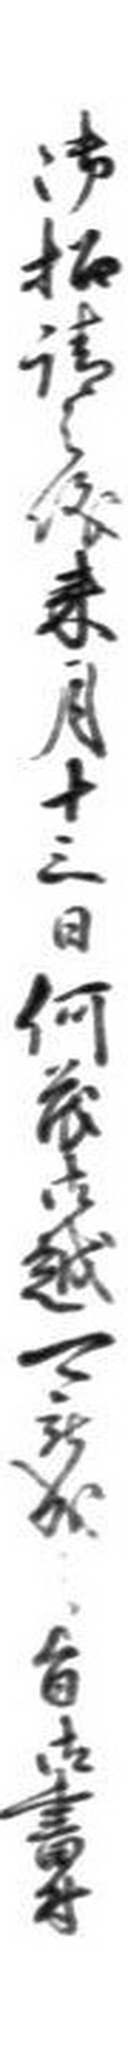御招請之儀来月十三日何茂御越可被成之旨御書付
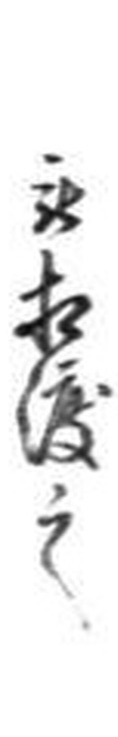被相渡之

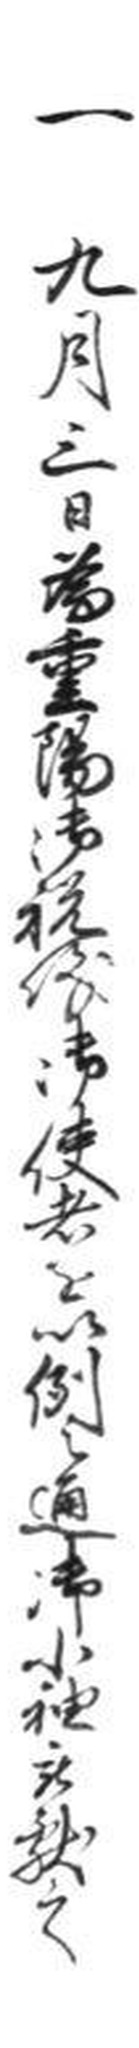一九月三日為重陽御祝儀御使者を以例之通御小袖被献之
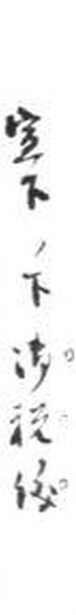宣下之下御祝儀
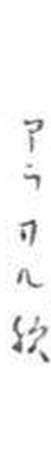アラサル歟
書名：家譜 三十二 吉邦公 従享保二年到享保三年
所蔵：福井県文書館 Fukui Prefectural Archives
